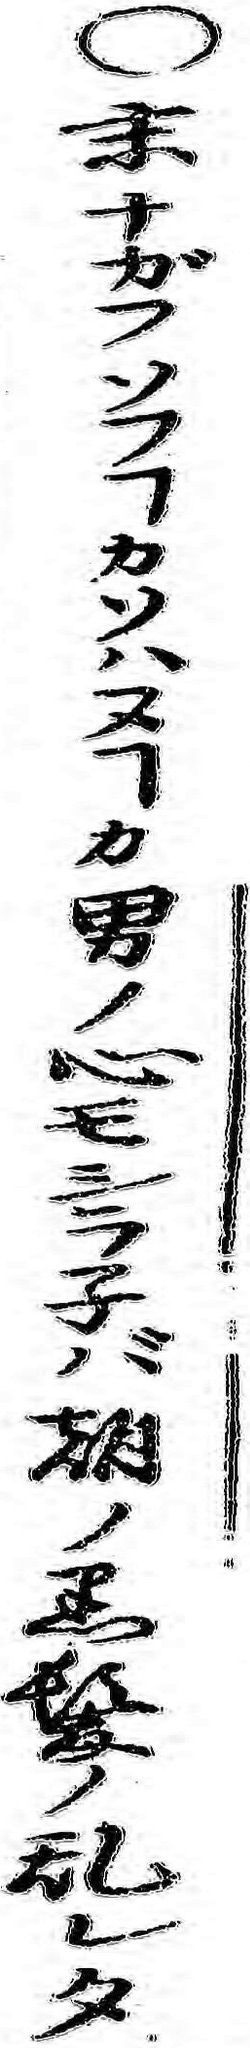◯末ナガフソフコトカソハヌコトカ男ノ心モシラネバ朝ノ黒髪ノ乱レタ
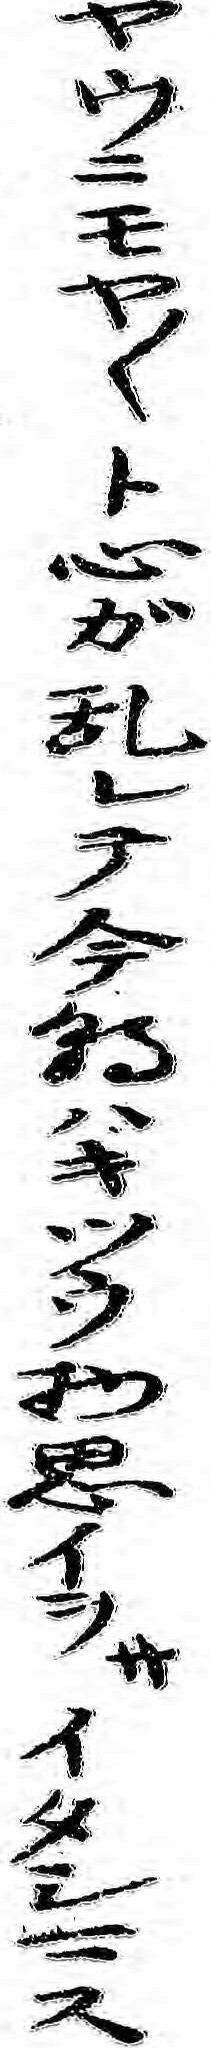ヤウニモヤ〳〵ト心ガ乱レテ今朝ハキツウ物思イヲサイタシマス
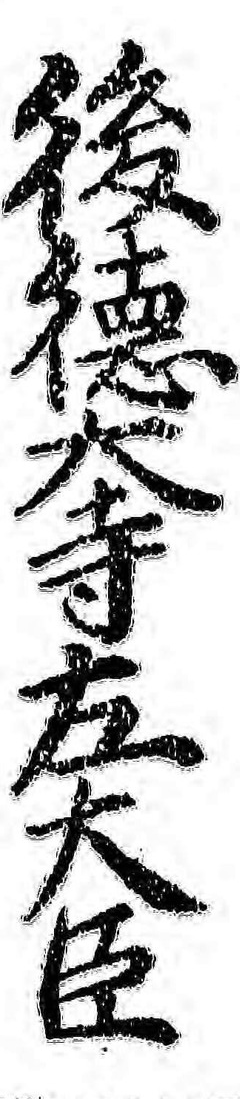後徳大寺左大臣
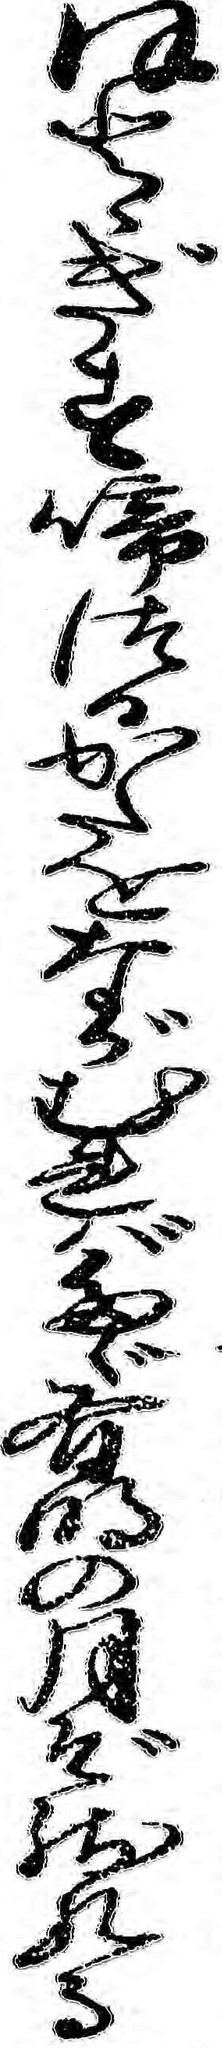ほとゝぎす啼つるかたをながむればたゞ有明のつきぞ残れる
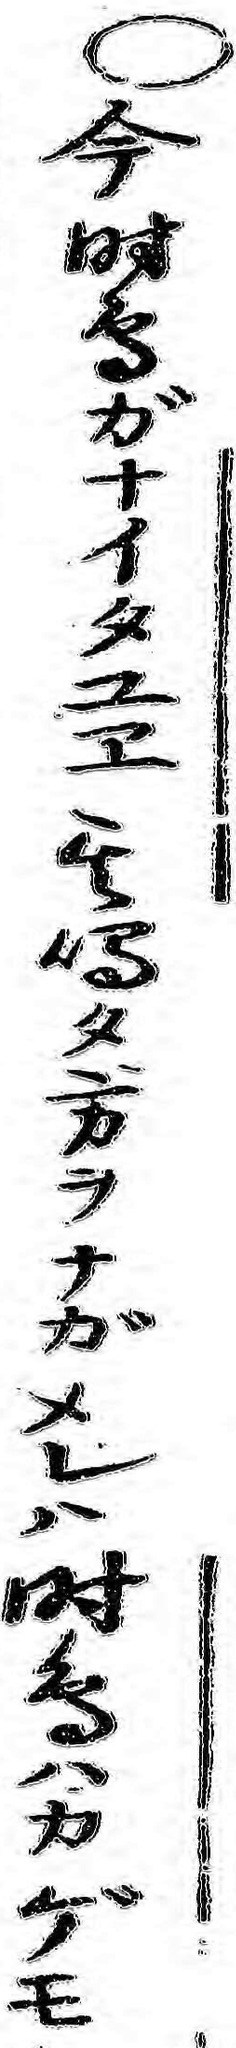◯今時鳥ガナイタユヱ其鳴タ方ヲナガメレハ時鳥ハカゲモ
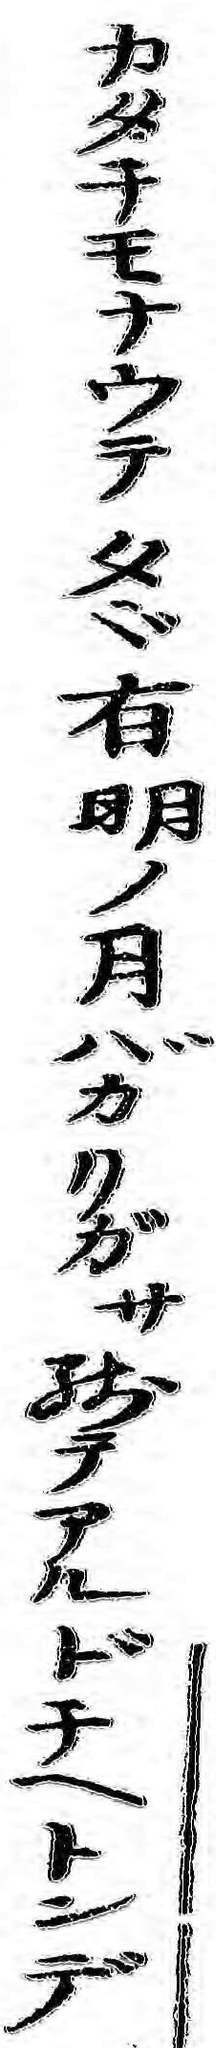カタチモナウテタヾ有明ノ月バカリガサ残テアルドチヘトンデ
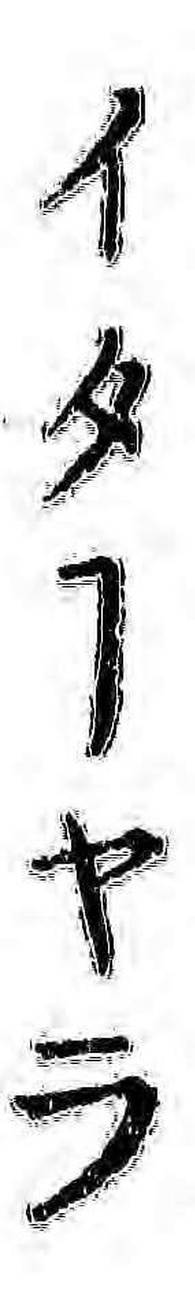イタコトヤラ
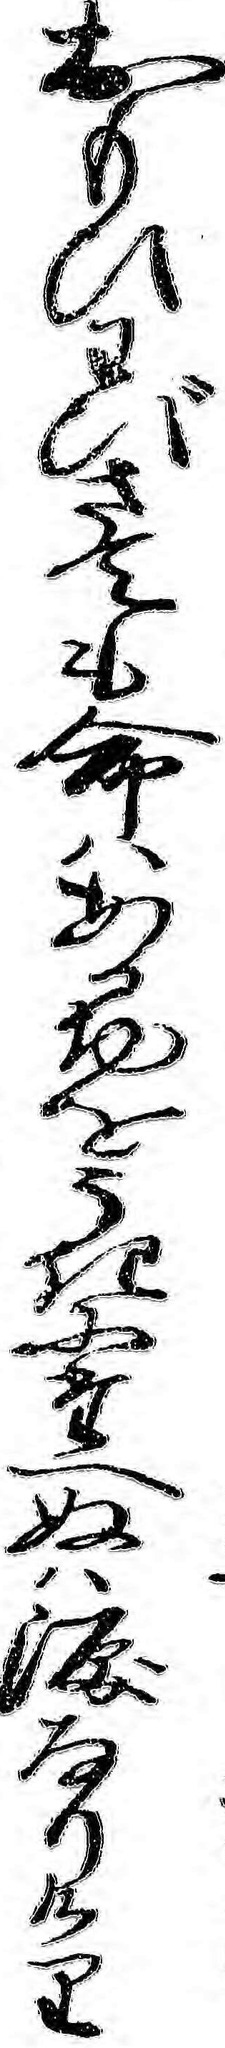おもひわびさても命はある物をうきにたへぬは涙なりけり
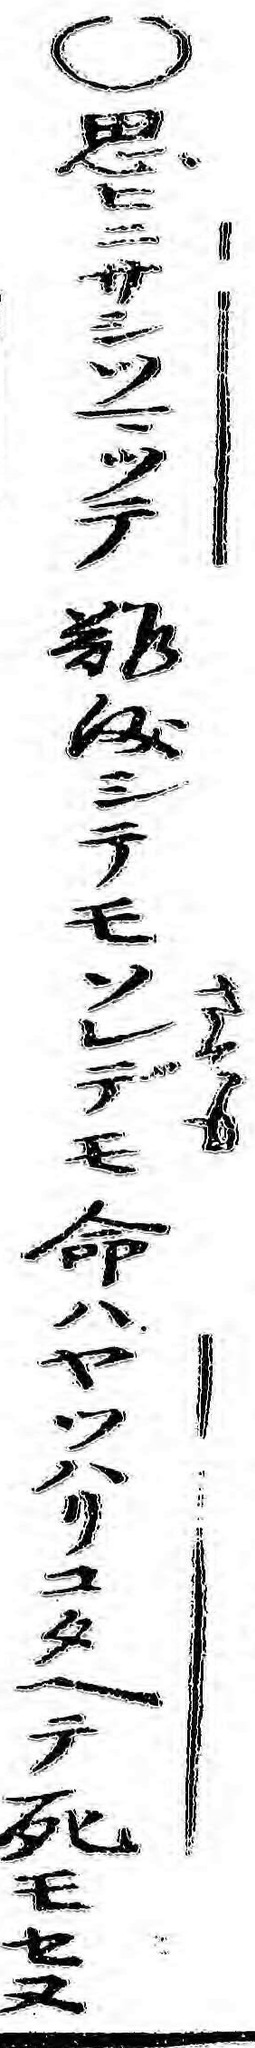◯思ヒニサシツマツテ難儀シテモソレデモ命ハヤツハリコタヘテ死モセヌ
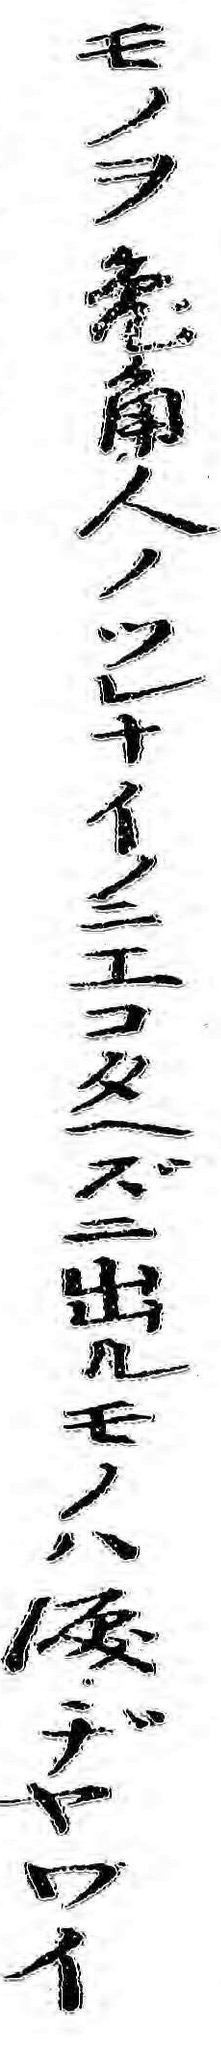モノヲ兎角人ノツレナイノニエコタヘズニ出ルモノハ涙ヂヤワイ
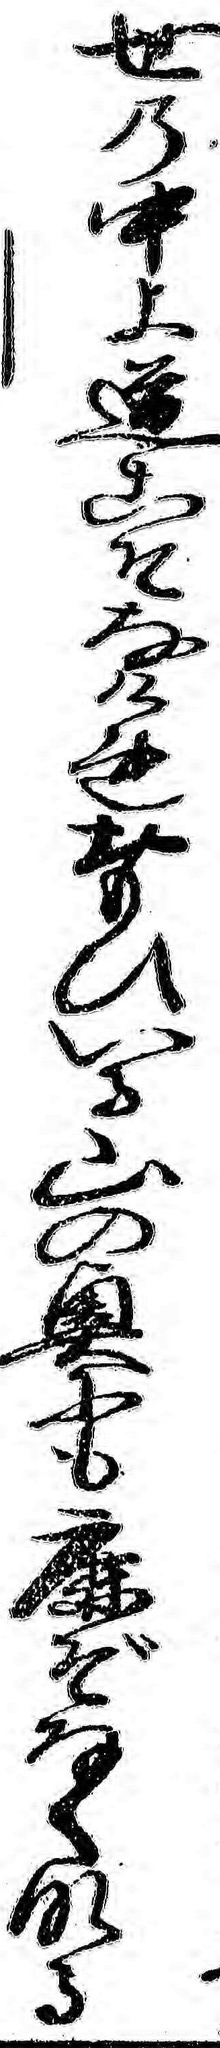世の中に道こそなけれおもひいる山の奥にも鹿ぞなくなる
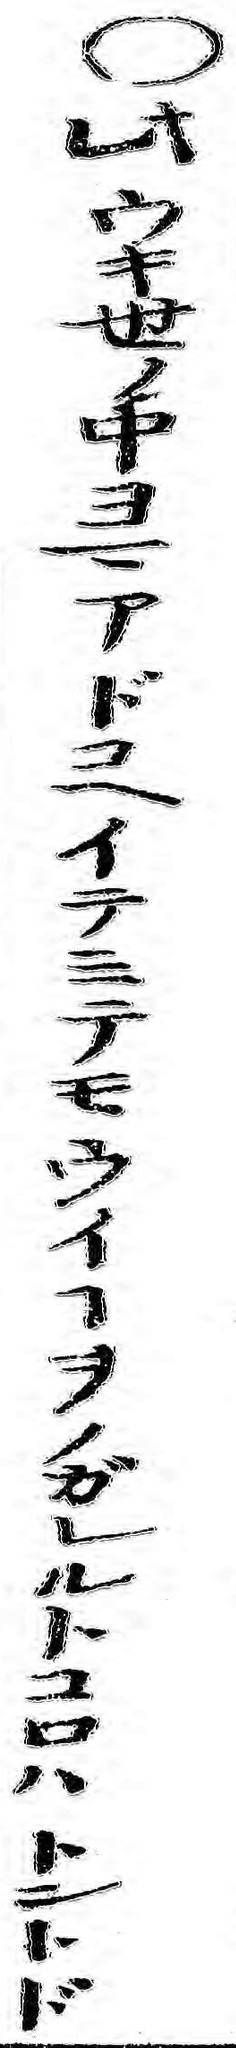◯此ノウキ世ノ中ヨマアドコヘイテミテモウイコトヲノガレルトコロハトントド
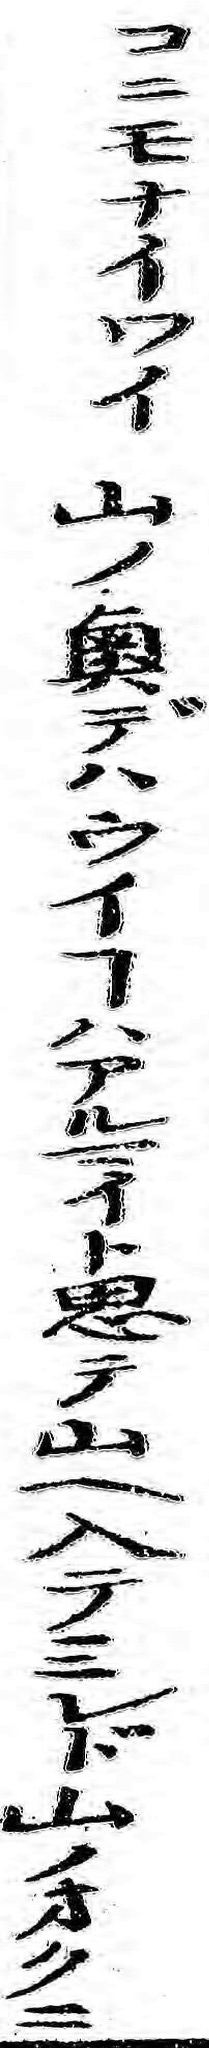コニモナイワイ山ノ奥デハウイコトハアルマイト思テ山ヘ入テミレド山ノオクニ
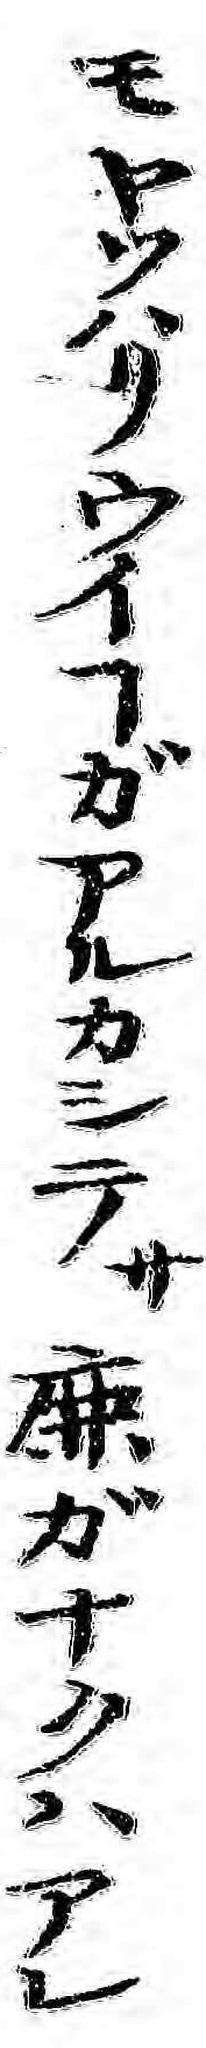モヤツハリウイコトガアルカシテサ鹿ガナクハアレ

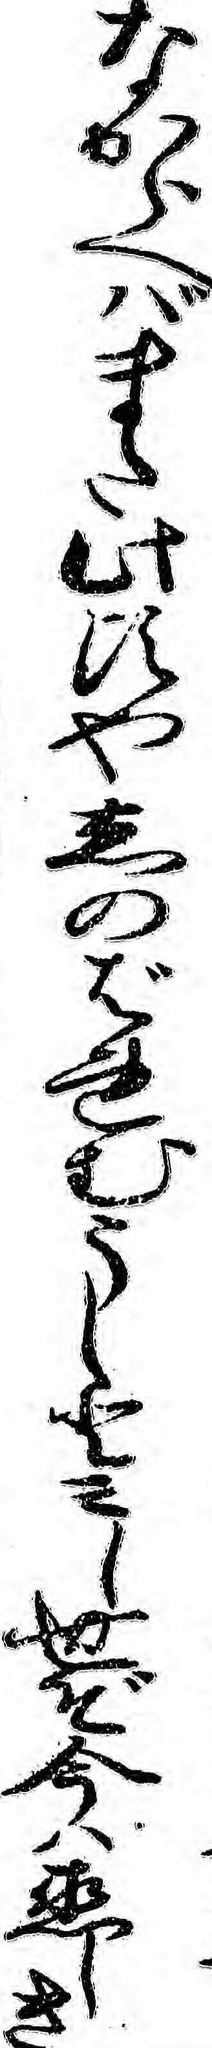なからへば又此頃やしのばれむうしとみし世ぞ今は恋しき
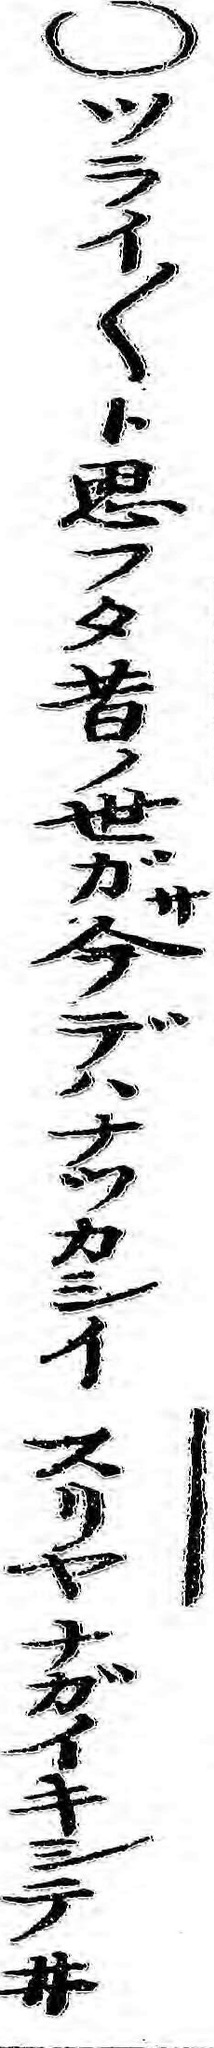◯ツライ〳〵ト思フタ昔ノ世ガサ今デハナツカシイスリヤナガイキシテヰ
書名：百人一首／小倉の山ふみ
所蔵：国文学研究資料館
